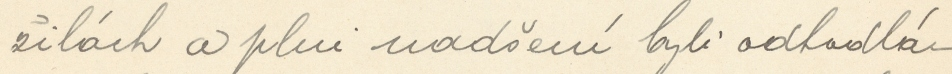žilách a plni nadšení byli odhodlá-
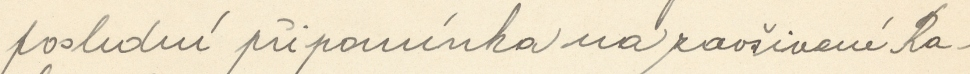poslední připomínka na zavšivené Ra-
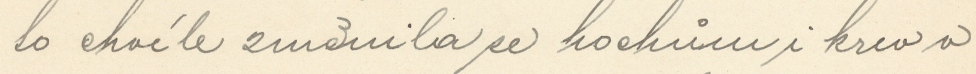to chvíle změnila se hochům i krev v
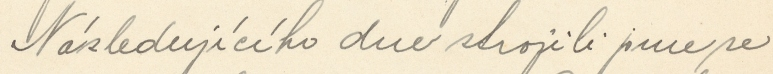Následujícího dne strojili jsme se
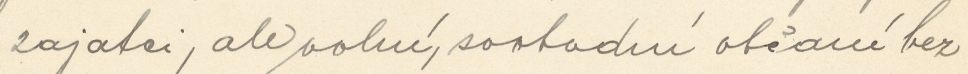zajatci, ale volní, svobodní občané bez
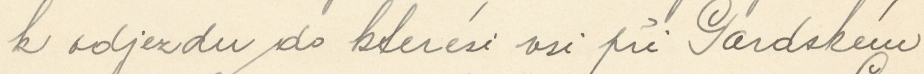k odjezdu do kterési vsi při Gardském
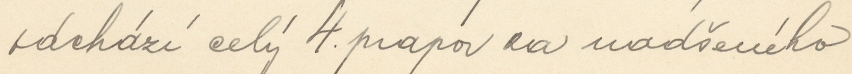odchází celý 4. prapor za nadšeného
